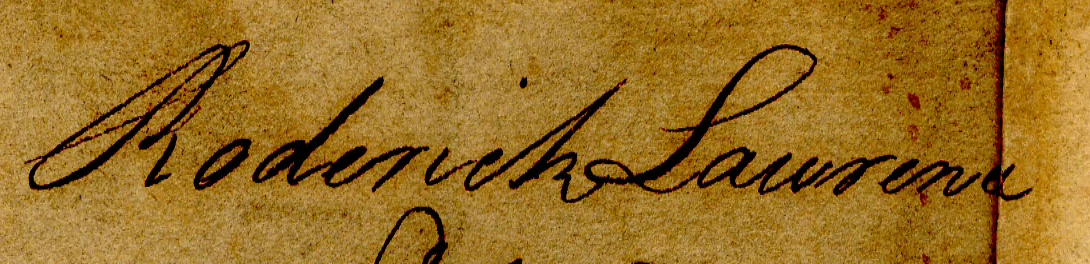Roderick Lawrence
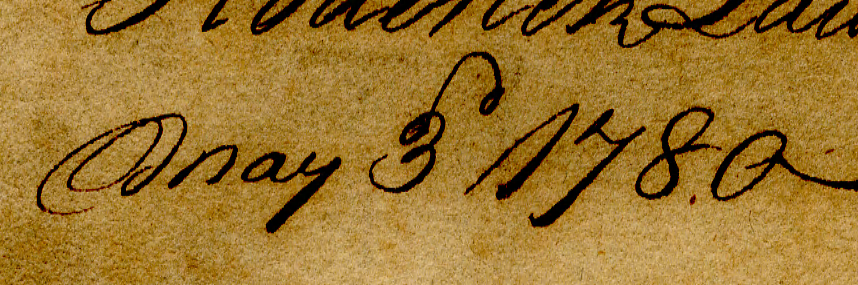May 3^d 1780
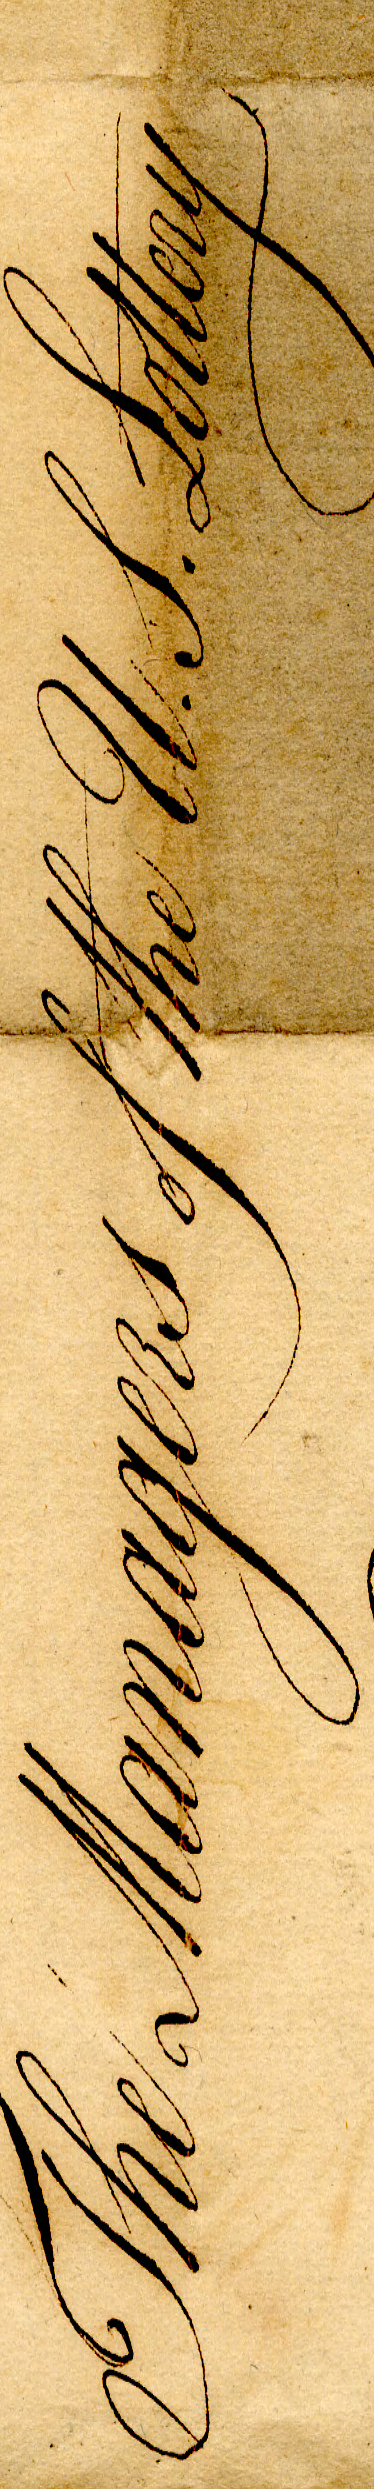The Managers of the U.S. Lottery
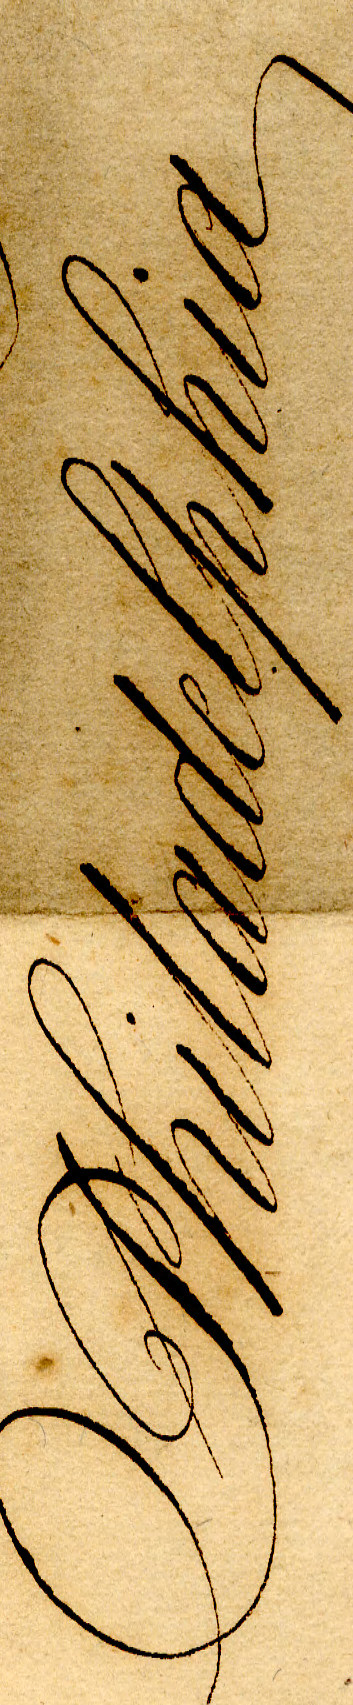Philadelphia
